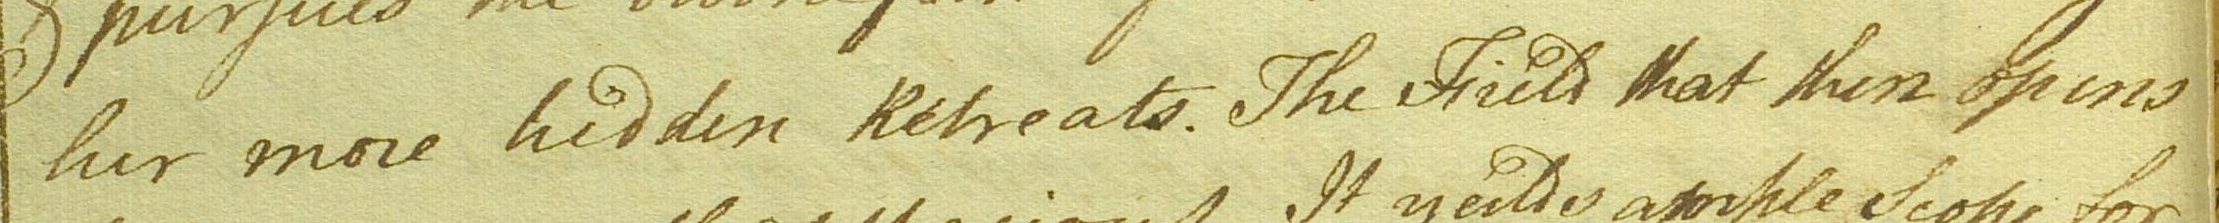her more hidden Retreats. The Field that then opens
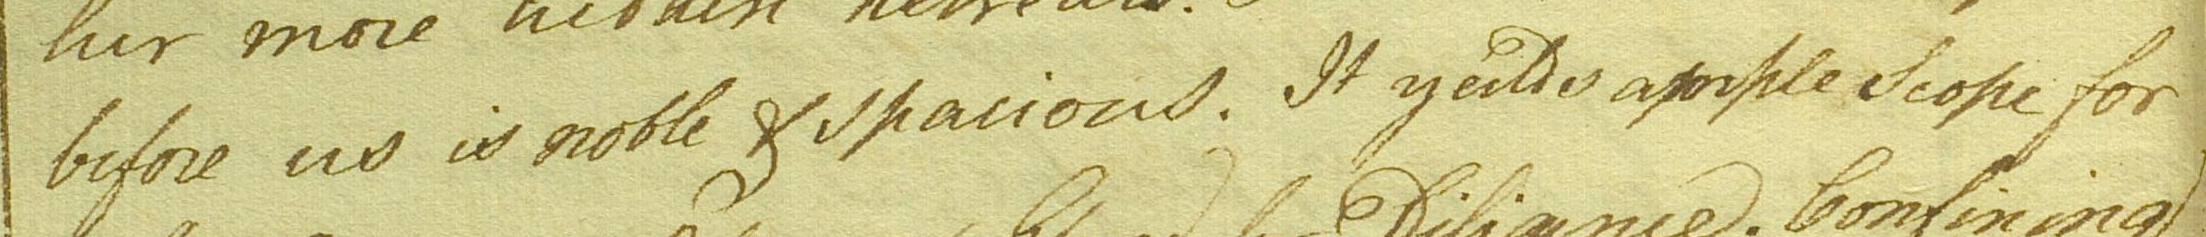before us is noble & spacious. It yeilds ample Scope for
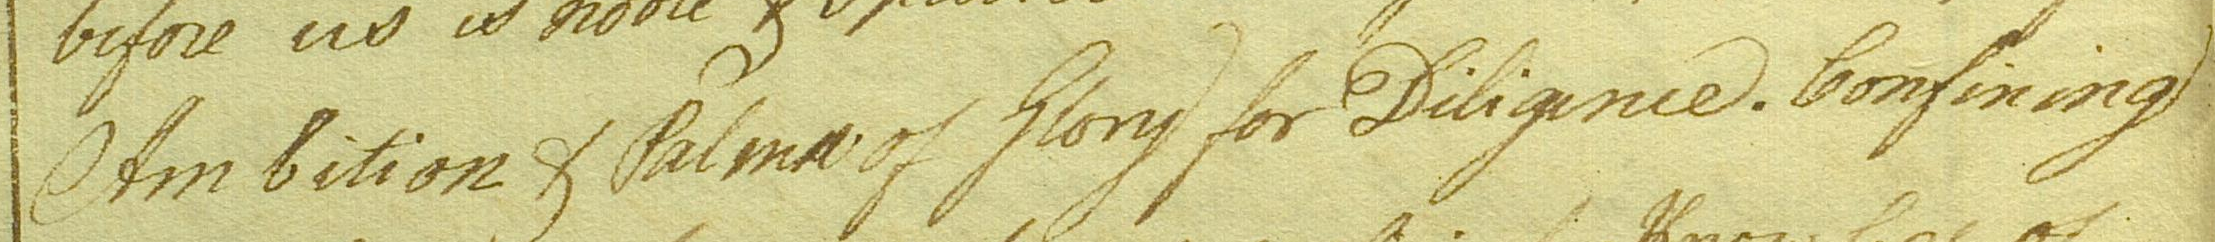Ambition & Palms of Glory for Diligence. Confining
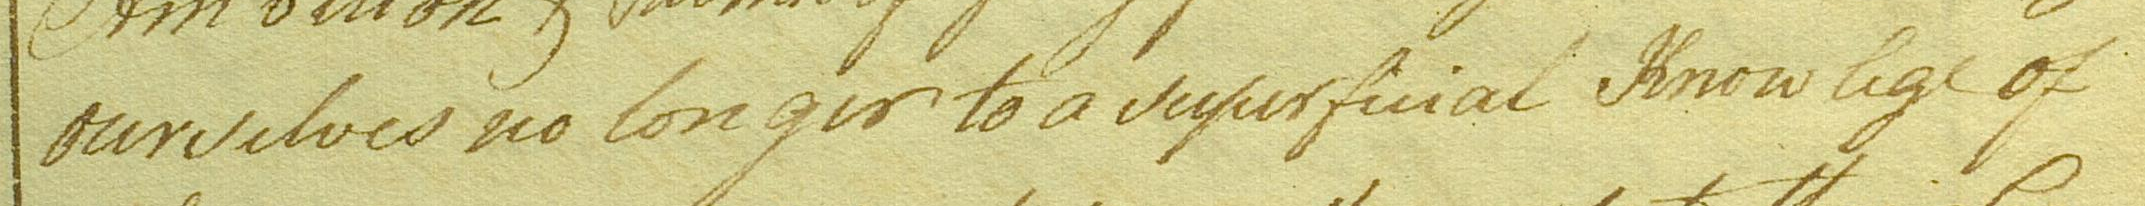ourselves no longer to a superficial Knowledge of
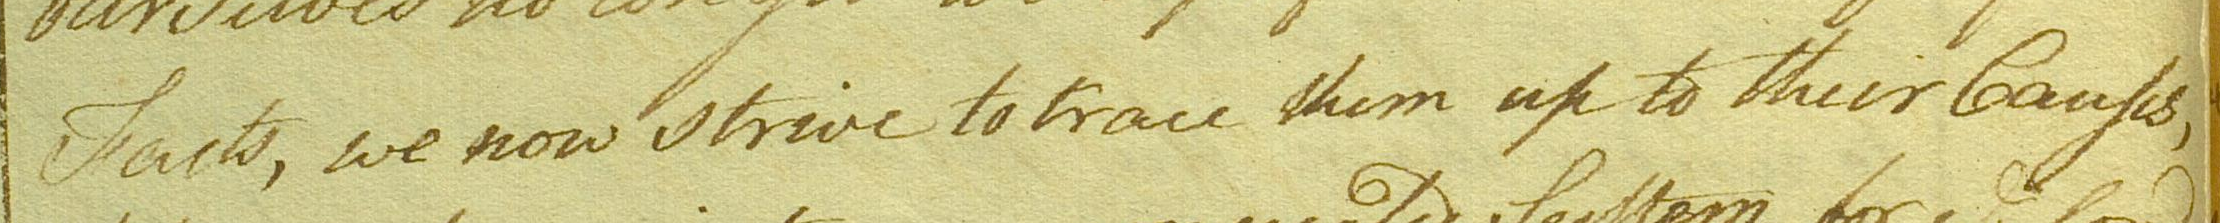Facts, we now strive to trace them up to their Causes,
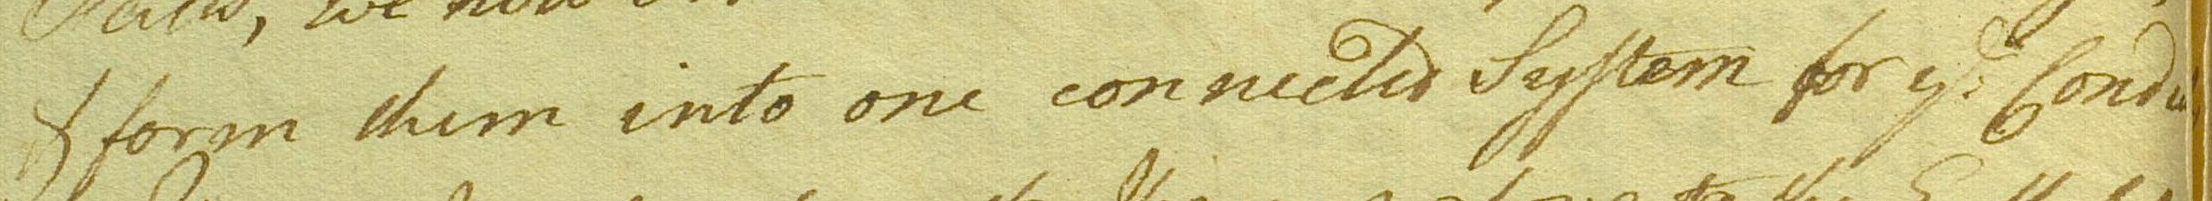& form them into one connected System for y^e. Conduct
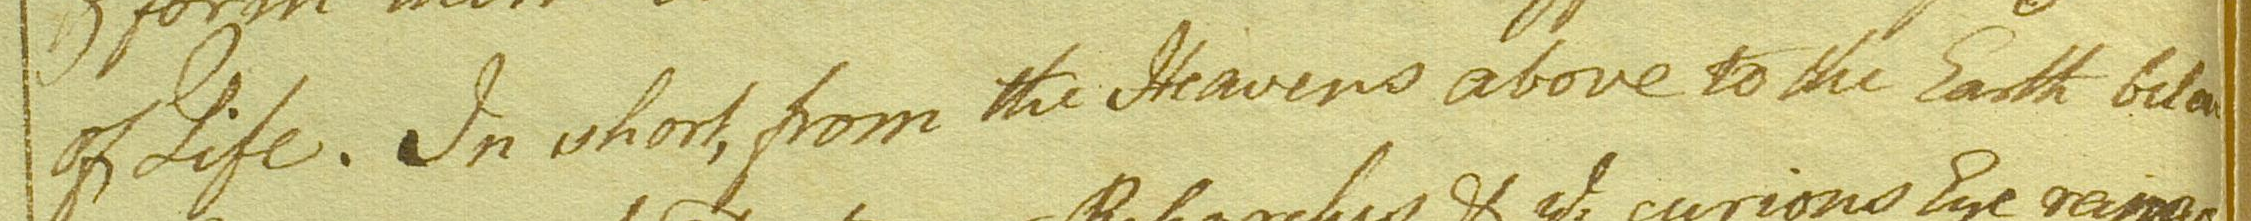of Life. In short, from the Heavens above to the Earth below
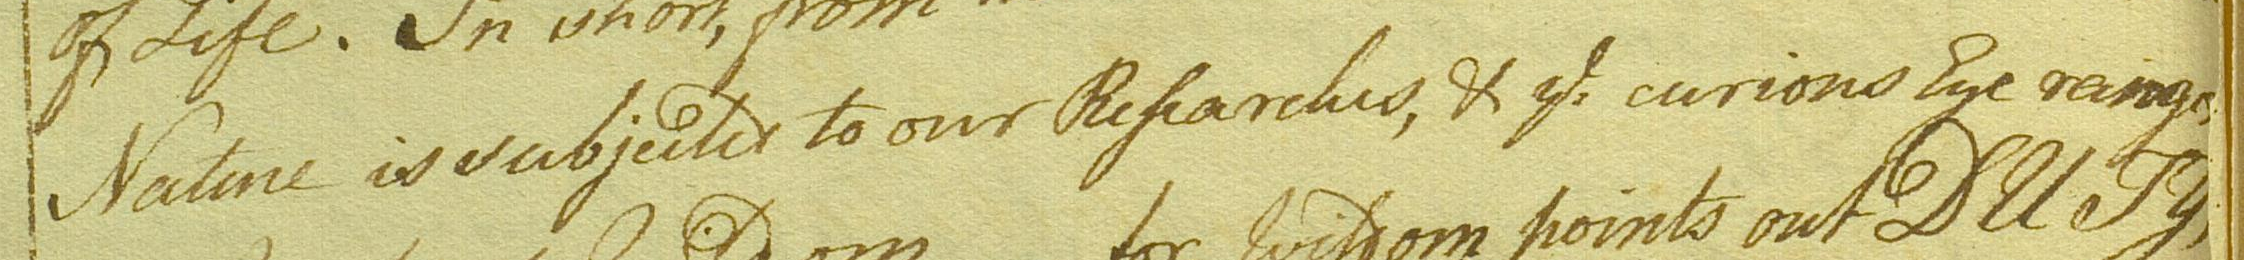Nature is subjected to our Researches & y^e curious Eye ranges
